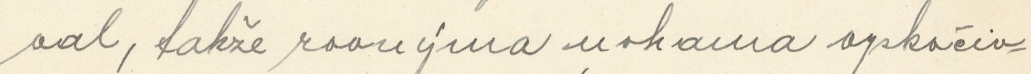val, takže rovnýma nohama vyskočiv-
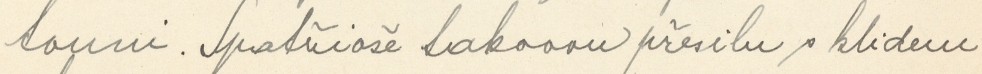touni. Spatřivše takovou přesilu s klidem
